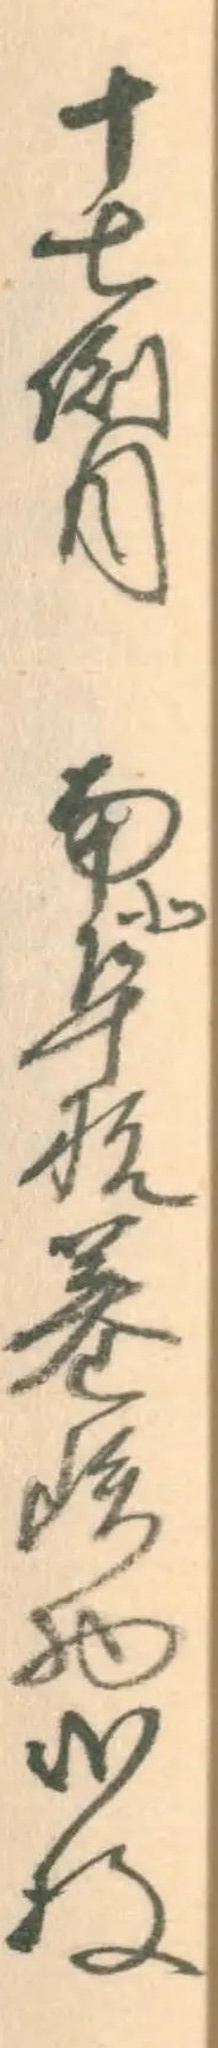十七側目南北耳杭巻鉄物弐枚
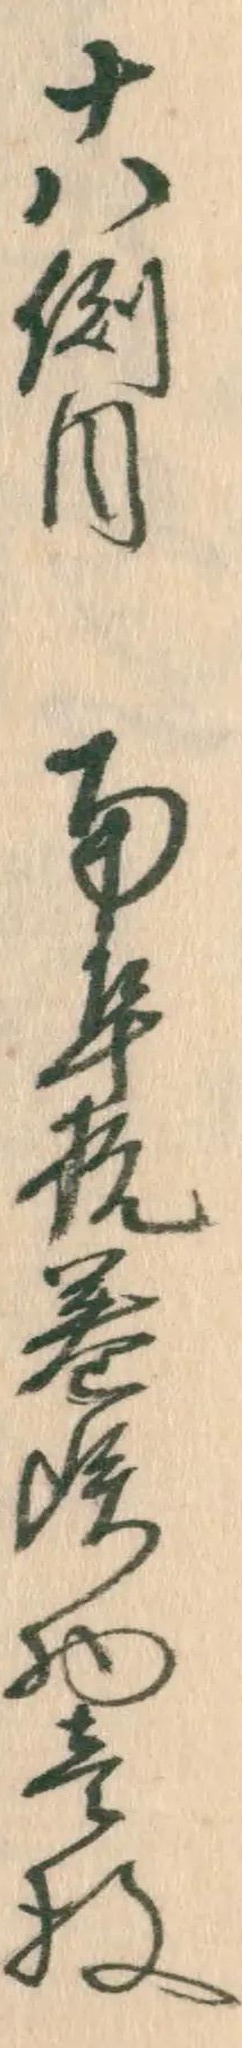十八側目南耳杭巻鉄物壱枚
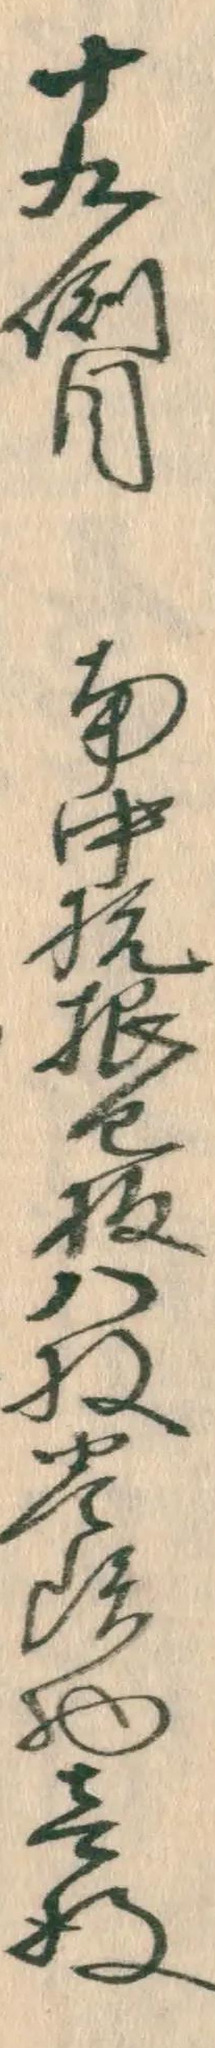十九側目南中杭根包板八枚巻鉄物壱枚
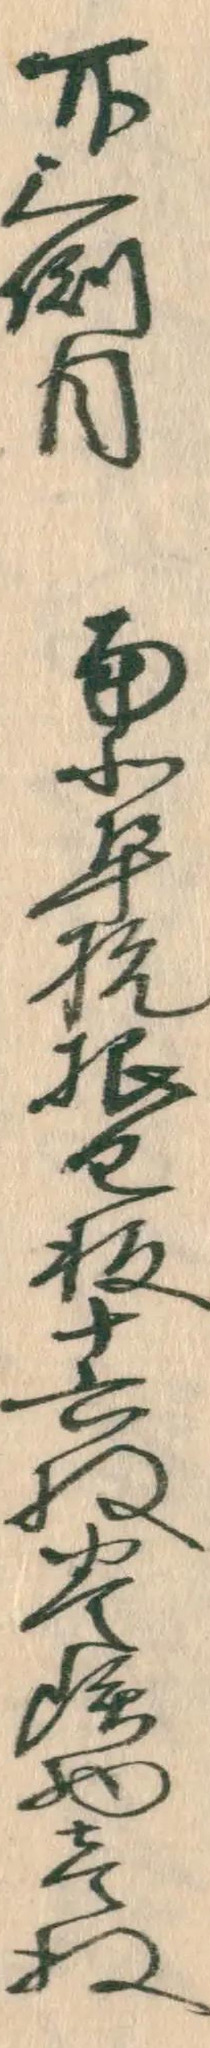廿三側目南北耳杭根包板十六枚巻鉄物壱枚
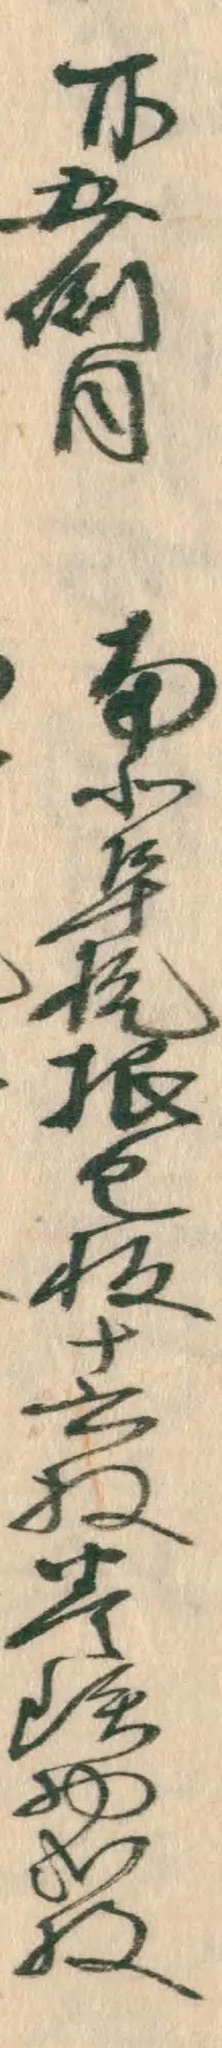廿五側目南北耳杭根包板十六枚巻鉄物弐枚
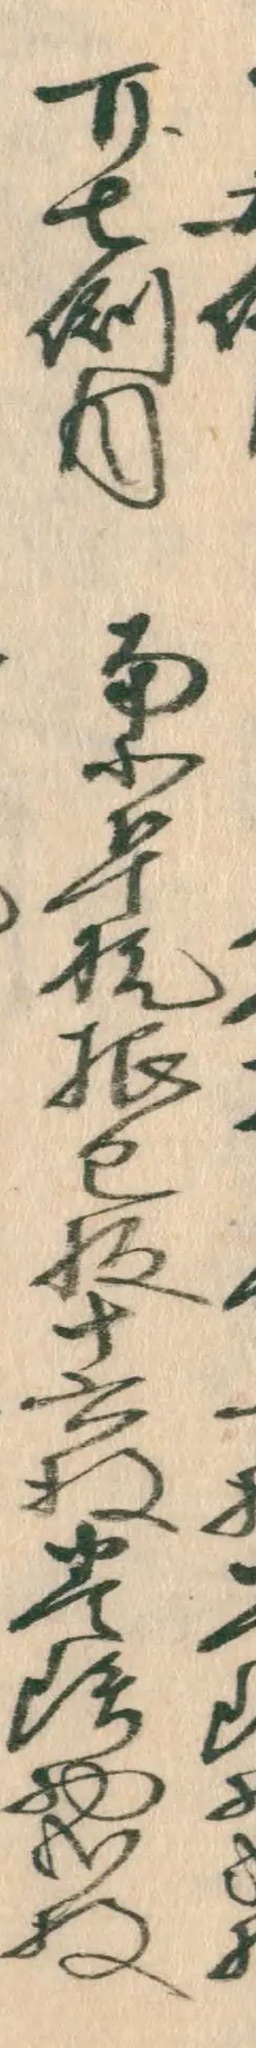廿七側目南北耳杭根包板十六枚巻鉄物弐枚
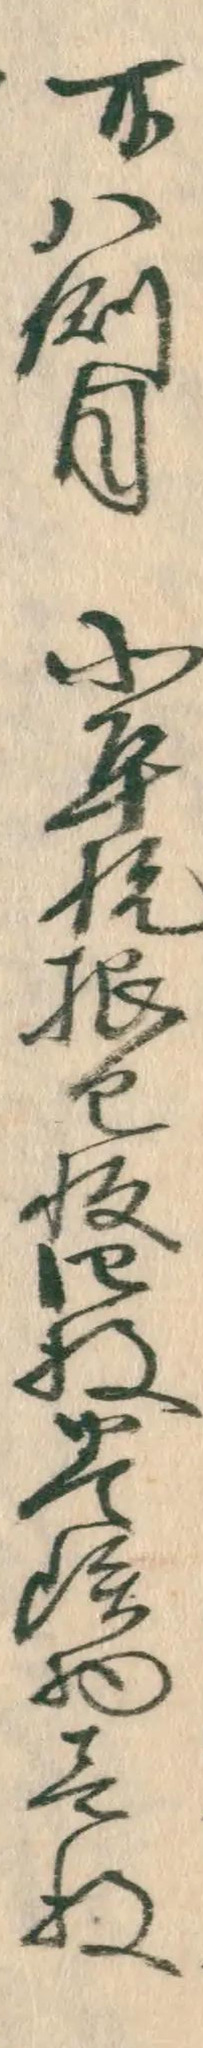廿八側目北耳杭根包板四枚巻鉄物壱枚
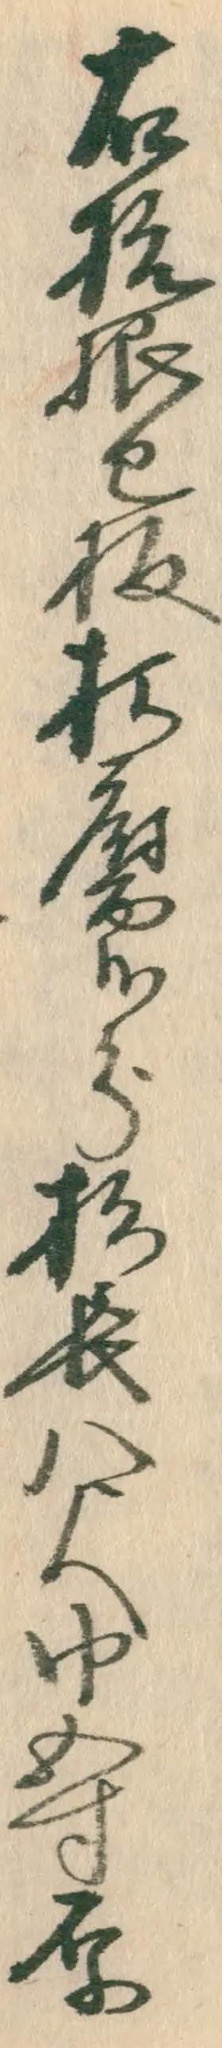右根包板朽腐候分杉長八尺巾五寸厚
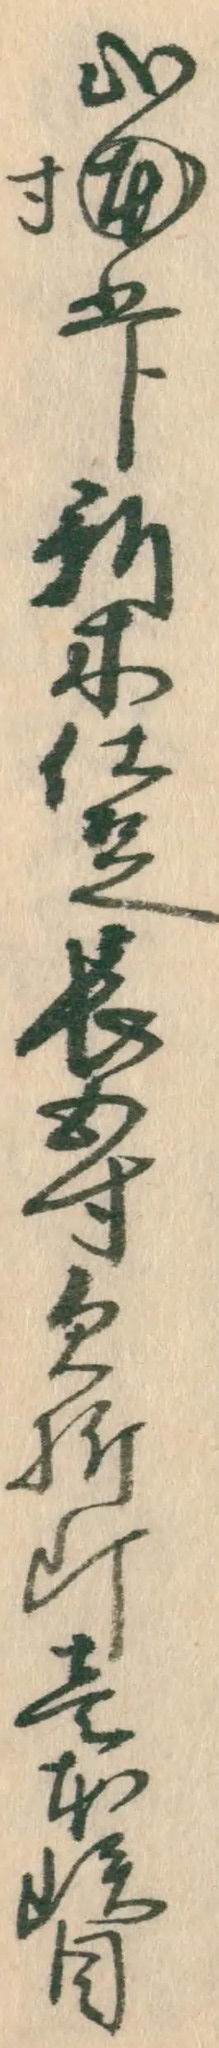弐寸五分新木仕足長五寸欠折釘壱本鉄目

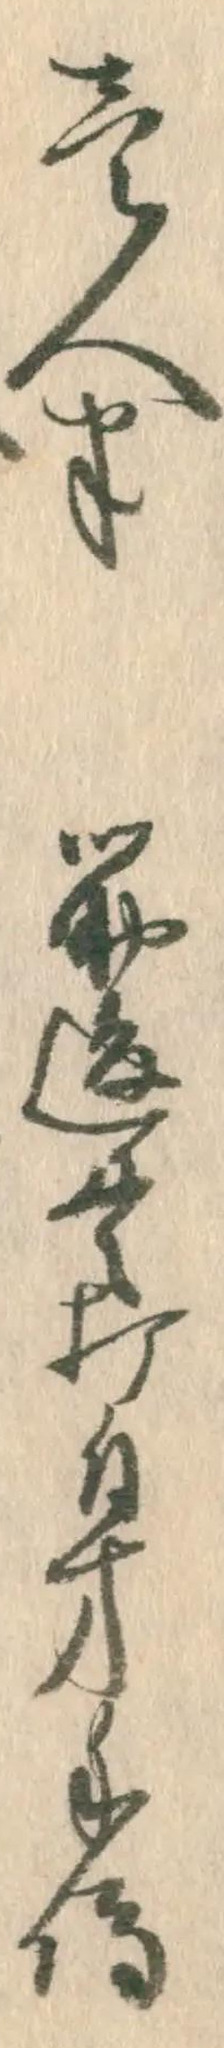壱人半筋違貫打付方手伝
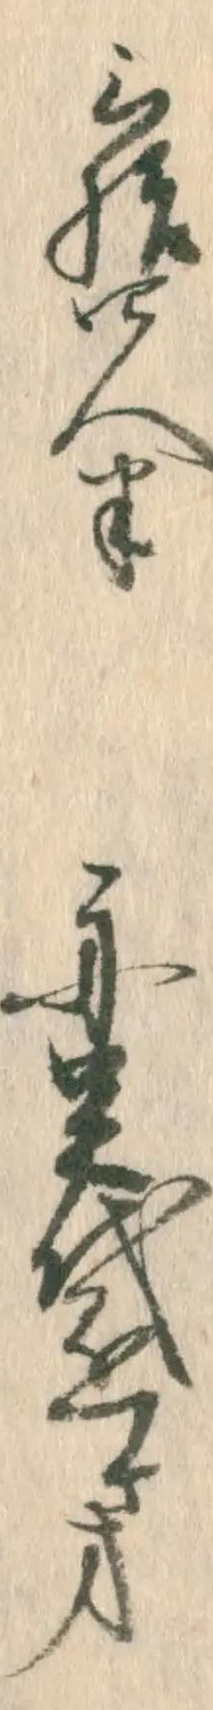三拾四人半舟足代懸ケ方
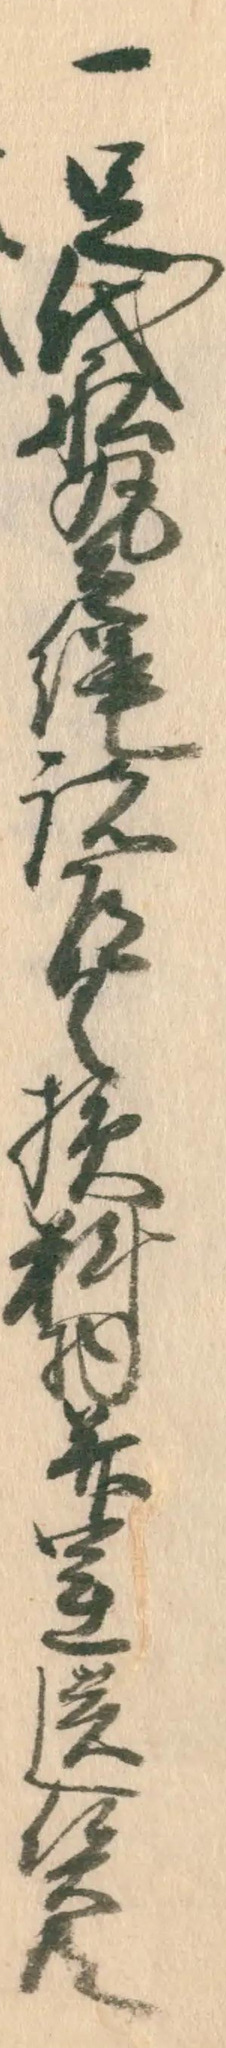一足代船丸太縄諸道具損料物并運送賃共
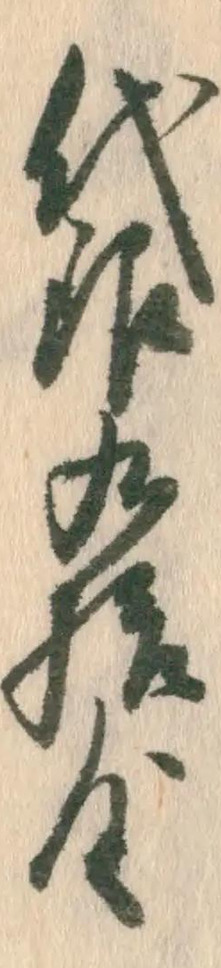代銀九拾匁
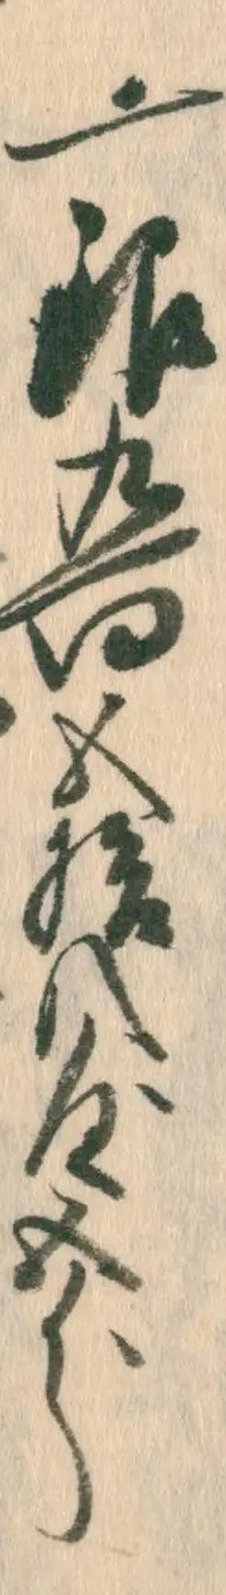〆銀九百五拾八匁五分
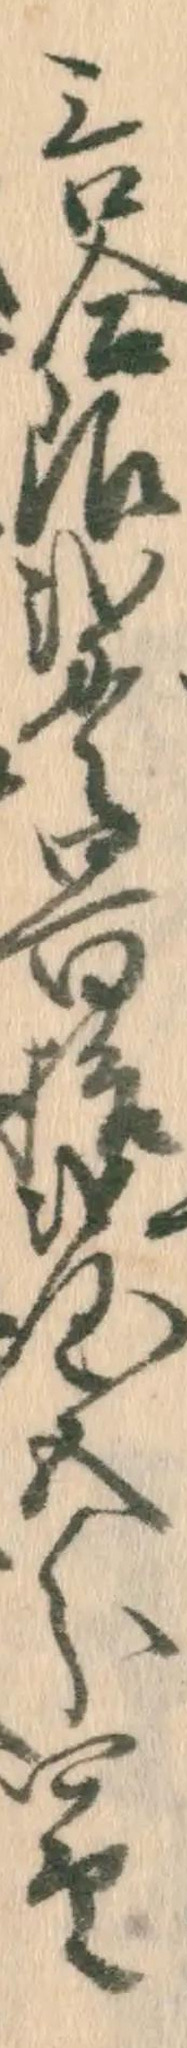三口合銀弐貫四百拾弐匁五分四厘
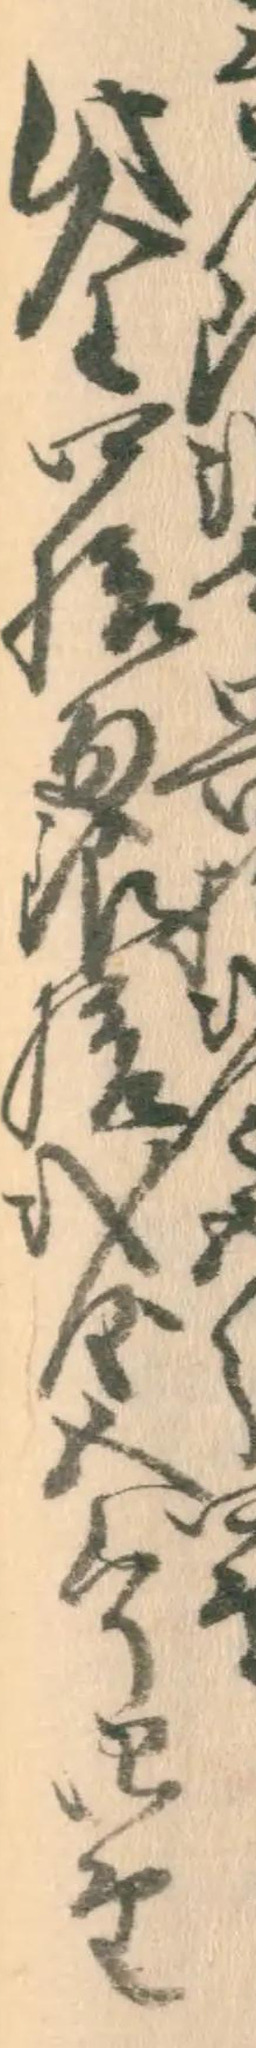此金四拾両銀拾弐匁五分四厘
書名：三橋 17巻. [8] 三橋小破御修復書留　但御奉行御掛リ替地震潰橋番屋　嘉永四亥年より安政二卯年迄　下
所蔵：国立国会図書館 National Diet Library, JAPAN
